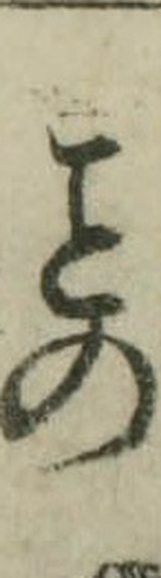ことの
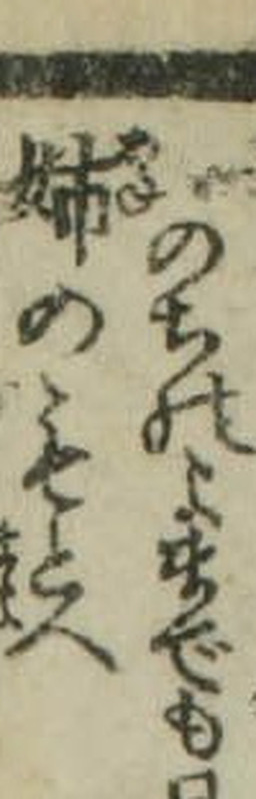姉のもとへ
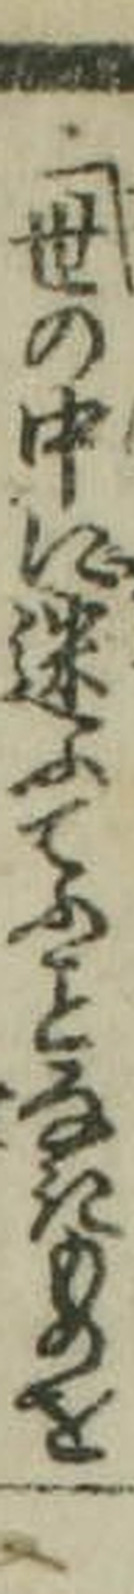〽世の中に迷ふてふことなきものを
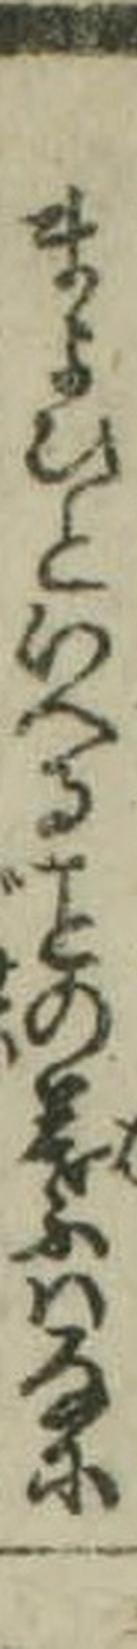まよひといへることの葉はなに
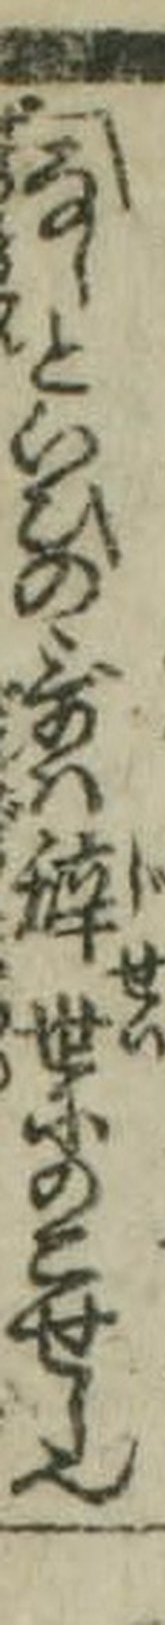〽なしといひの哥は辞世にのこせし也
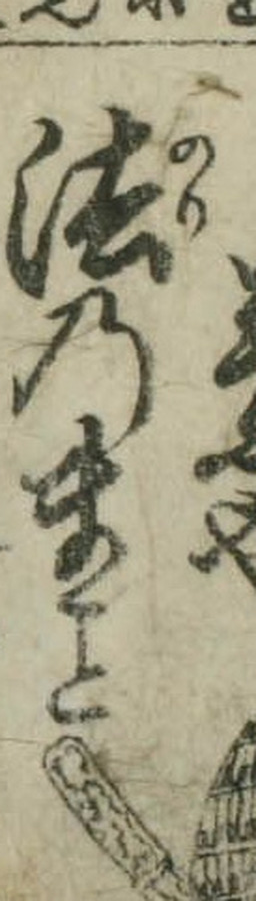法のまこと
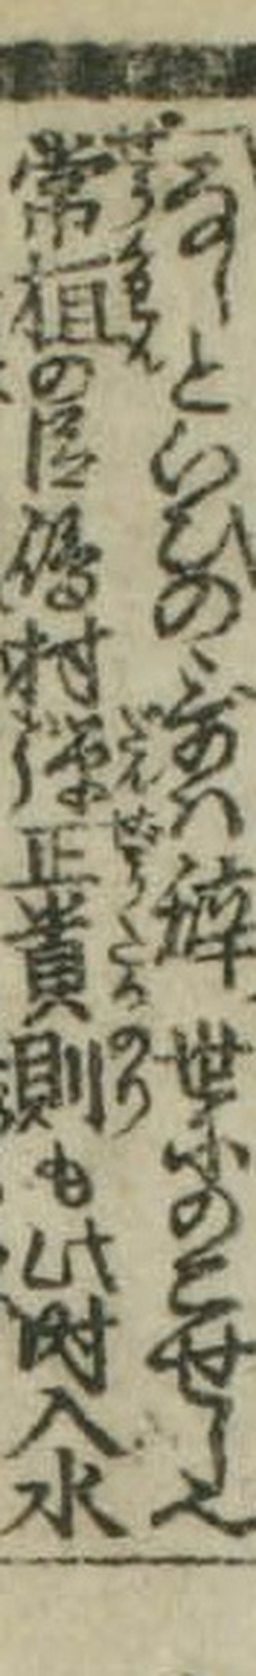常桓の臣嶋村弾正貴則も此時入水
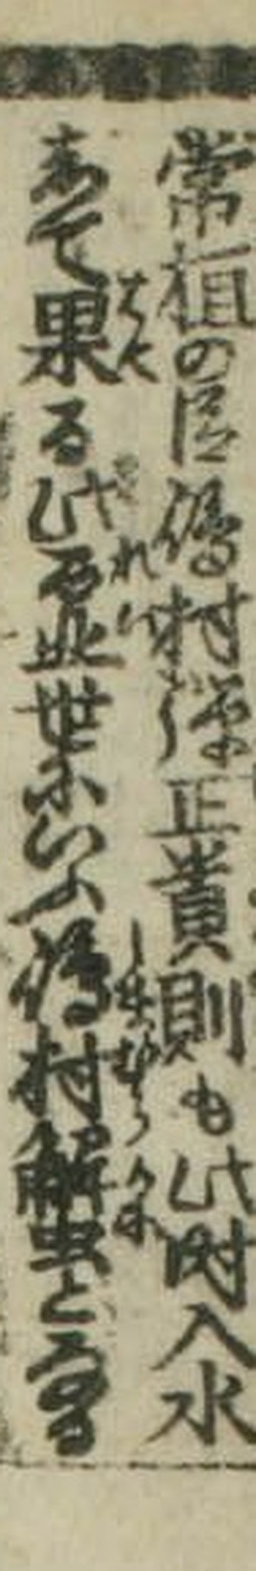して果る此霊世にいふ嶋村蟹となる
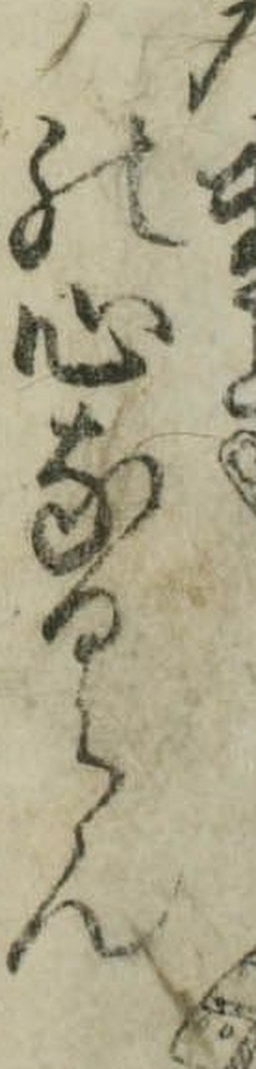の心なるらん

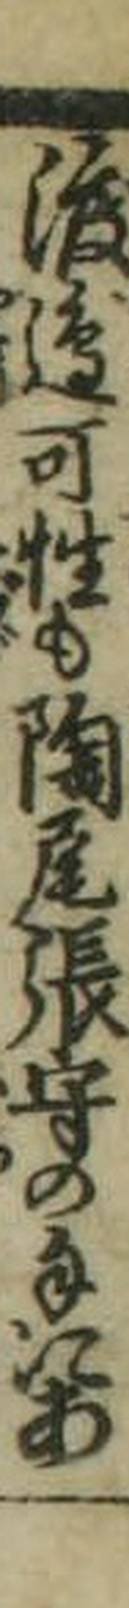渡辺可性も陶尾張守の手にあ
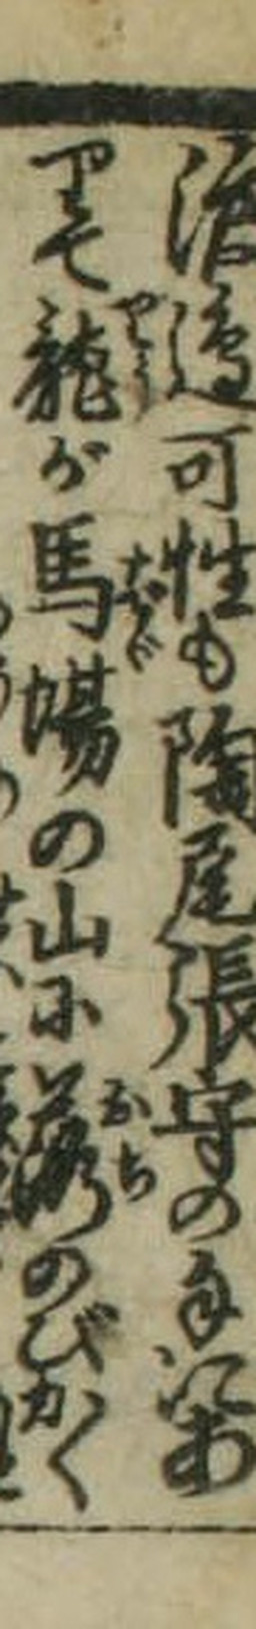りて龍が馬場の山に落のびかく
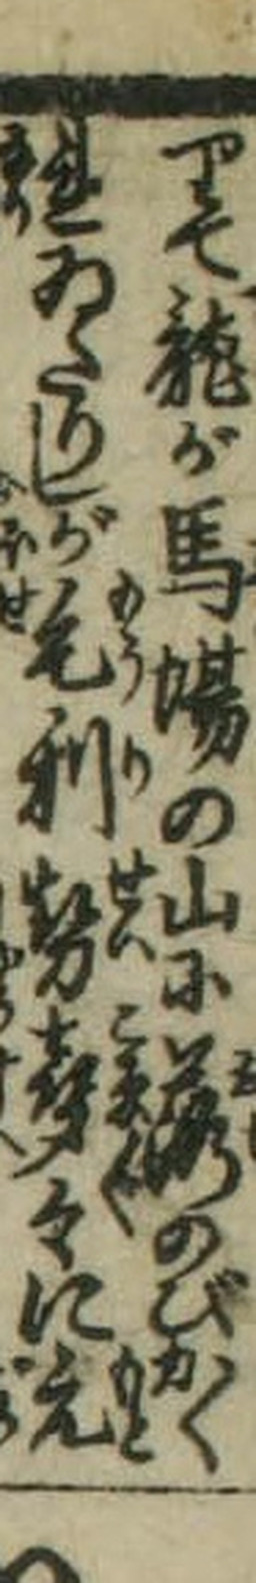れゐたりしが毛利勢声々に元
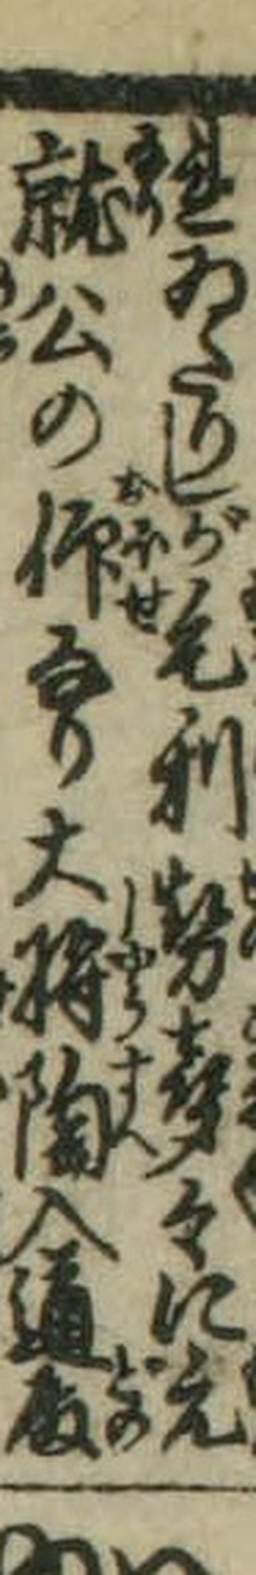就公の仰なり大将陶入道殿
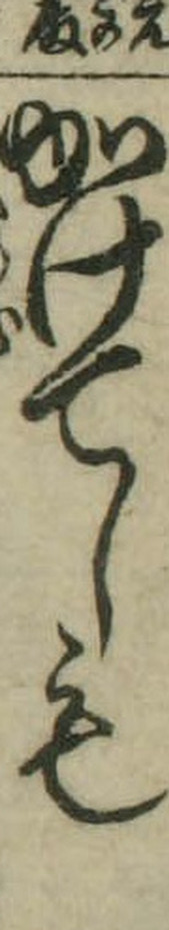かけてしも
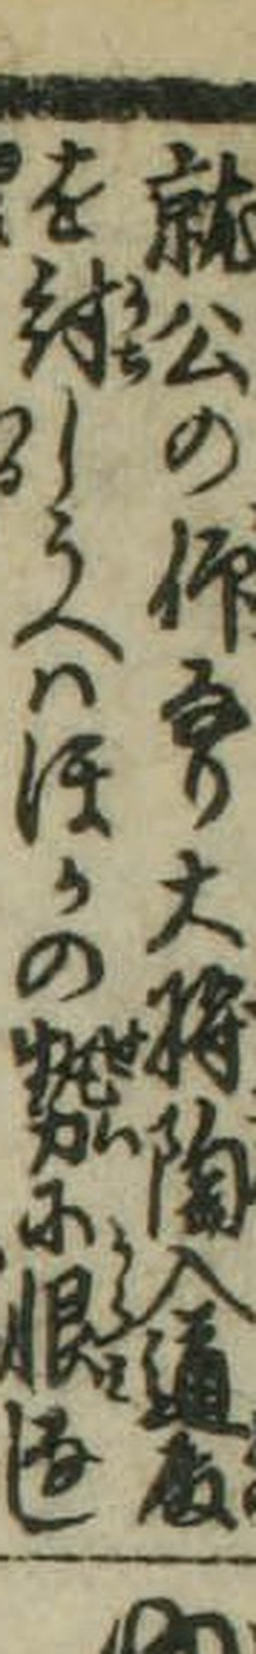を討しうへはほかの勢に恨なし
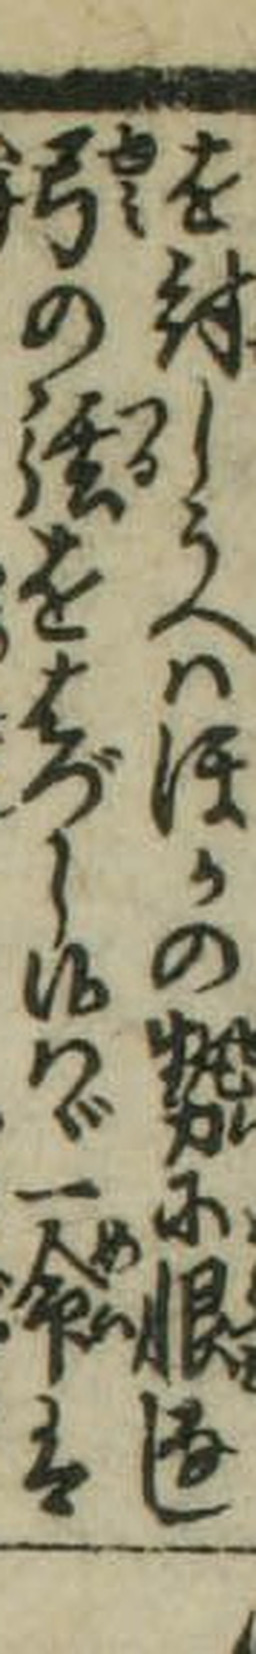弓の弦をはづし候はば一命は
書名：續英雄百人一首
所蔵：東京学芸大学附属図書館
